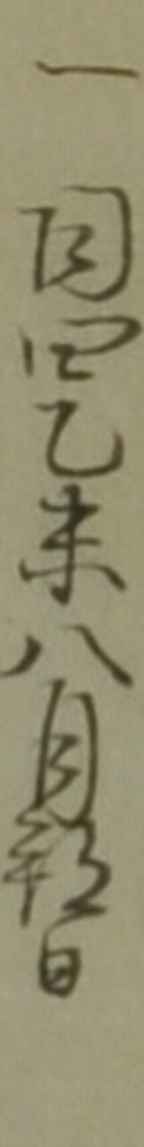一同四乙未八月朔日
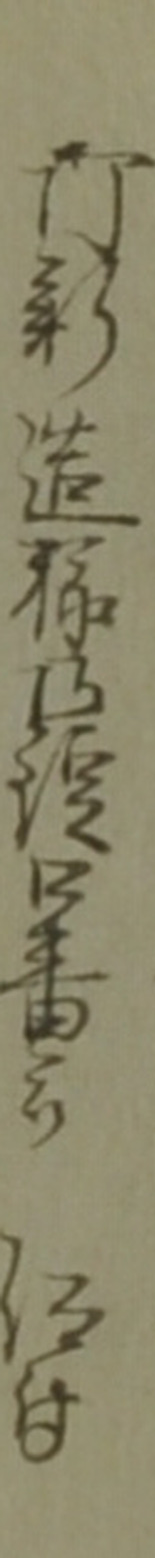御新造様御錠口番被仰付
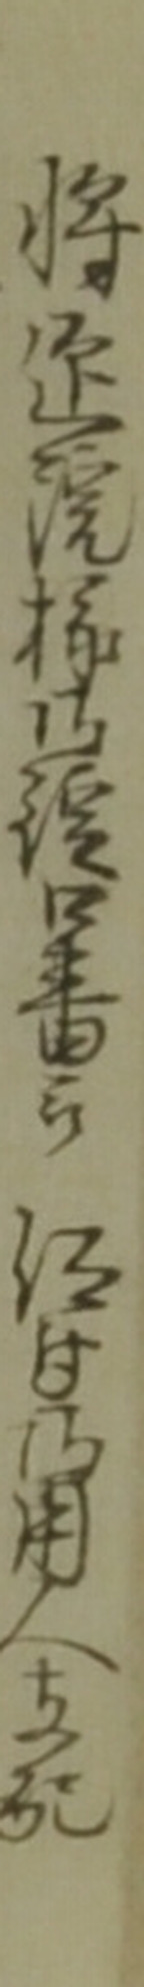将迎院様御錠口番被仰付御用人支配
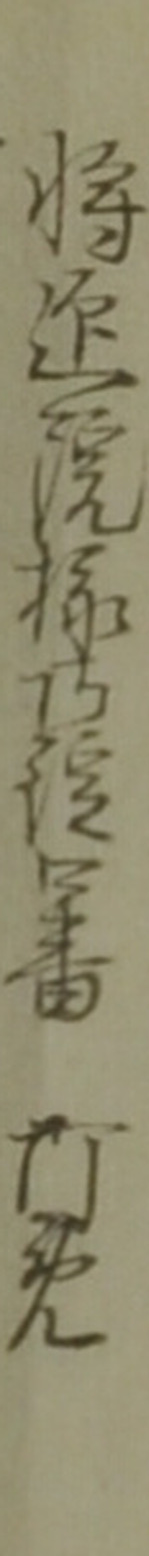将迎院様御錠口番御免
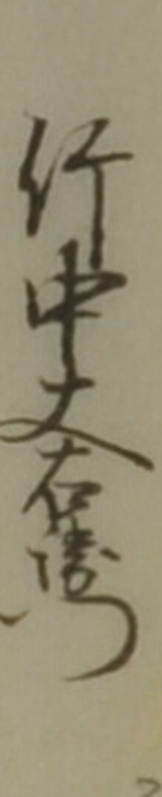竹中文右衛門
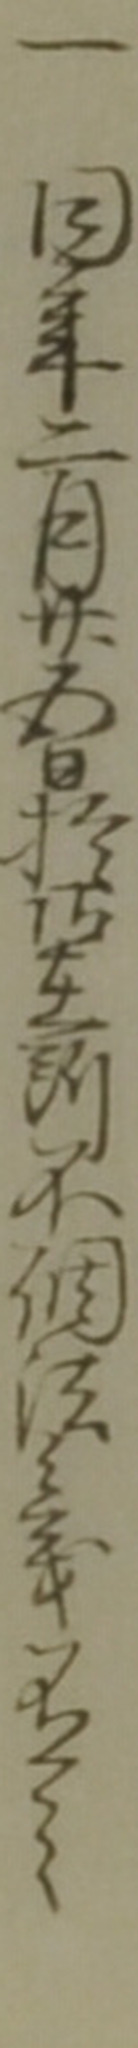一同年二月廿五日於御在所不調法之義有之
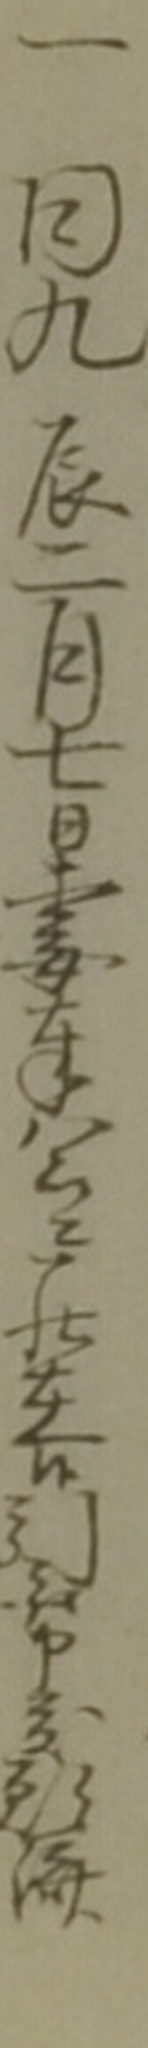一同九辰二月七日妻奉公ニ罷在候引取申度願済
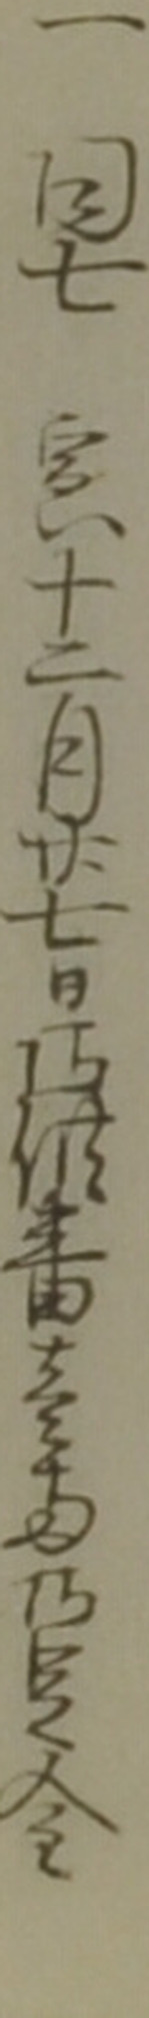一同七寅十二月廿七日御供番壱両御足金
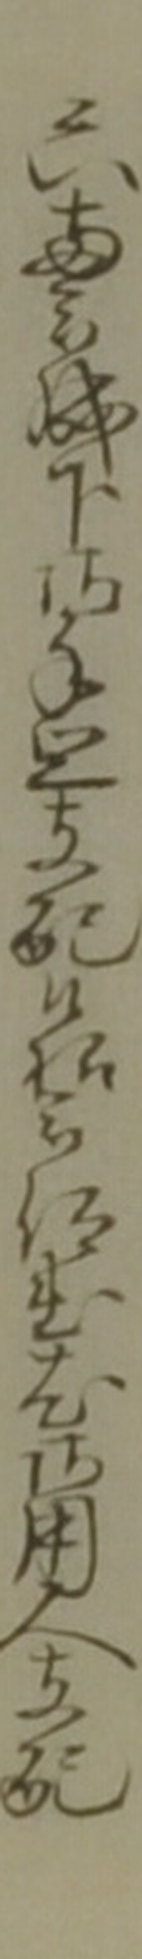六両被成下御手廻支配候様被仰出尤御用人支配
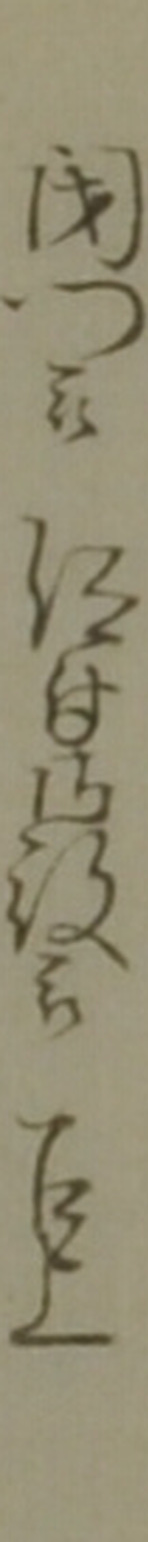閉門被仰付御役被召上
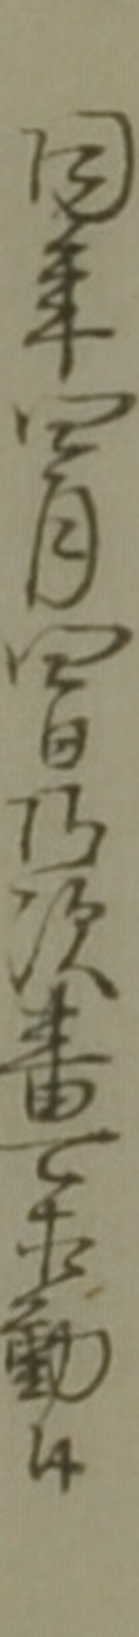一同年四月四日御次番可相勤候

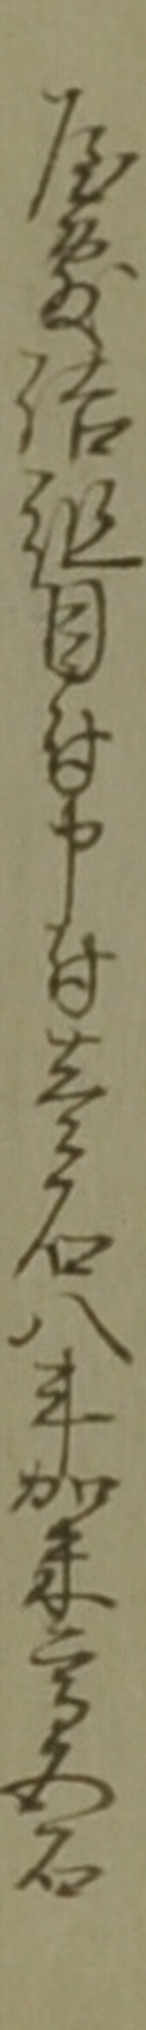屋敷詰組目付申付壱石八斗加米高五石
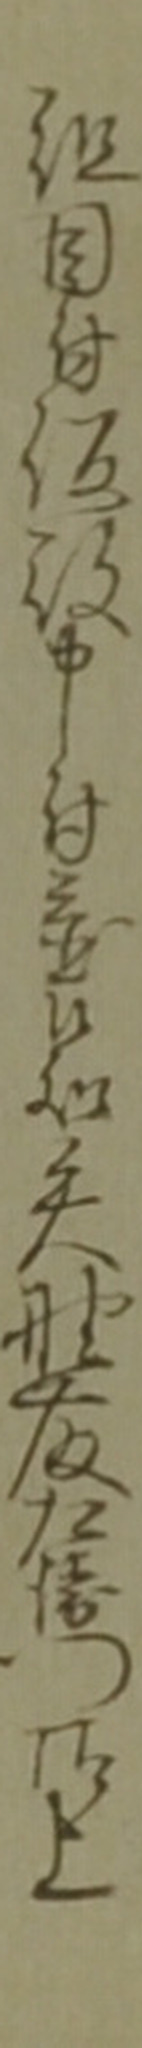組目付仮役申付置候処矢野藤左衛門御上
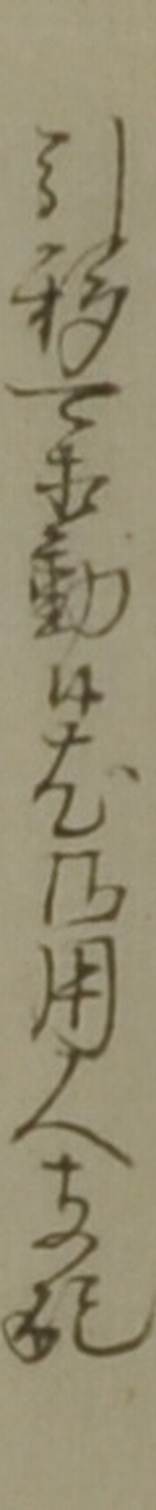引移可相勤候尤御用人支配
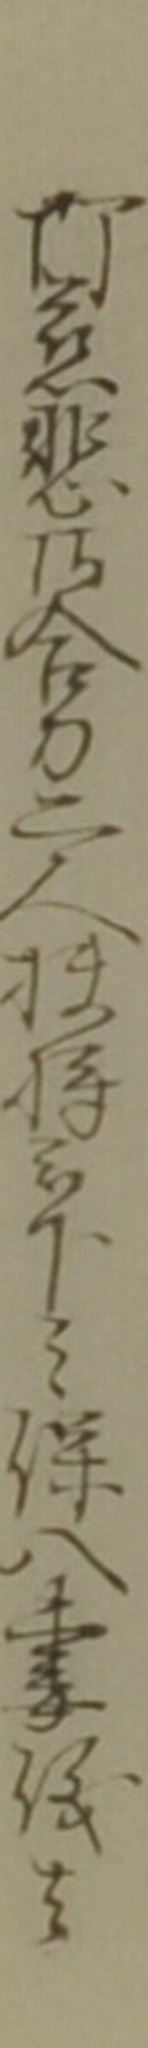御慈悲尾合力二人扶持被下之保八妻儀者
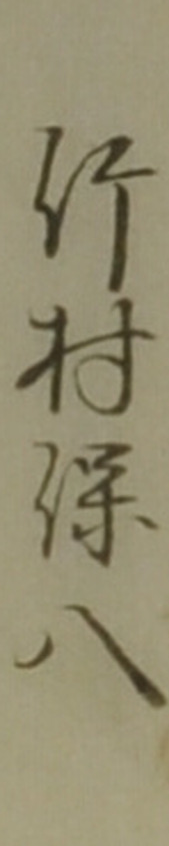竹村保八
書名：無足廃家（壱）
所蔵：伊那市立高遠町図書館・合同会社AMANE
